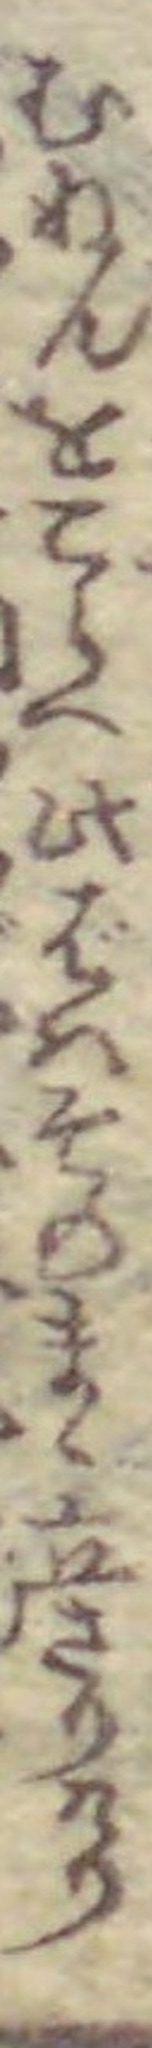むねんをこらへ此ばはそのまゝ立さりけり
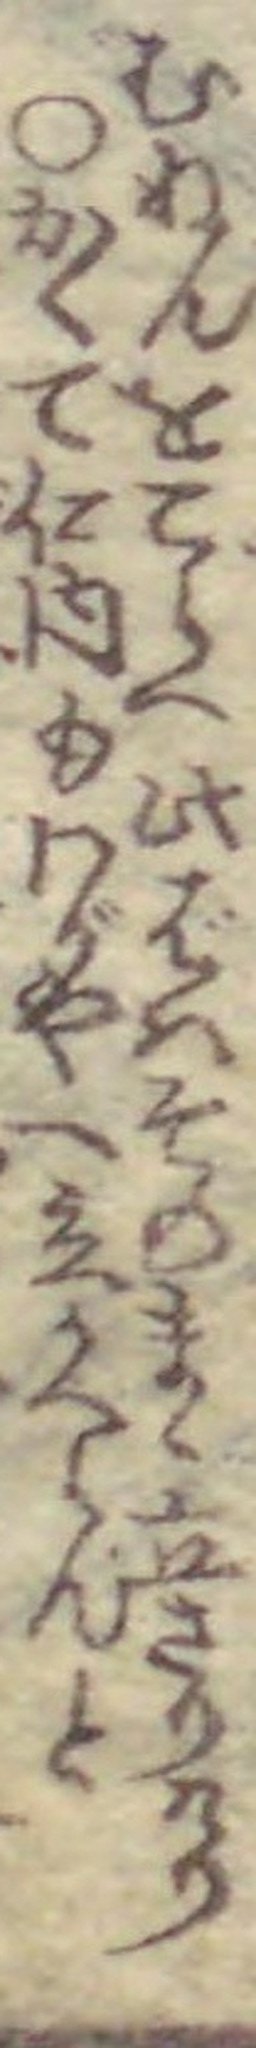○かくて仁内もわがやへ立かへらんと
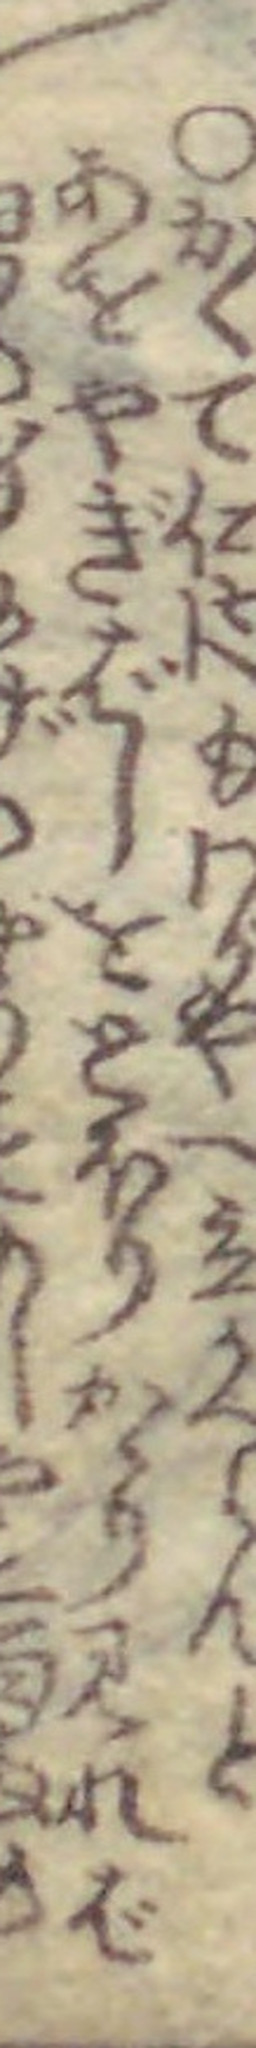あをやぎばしをとほりかゝり見れば
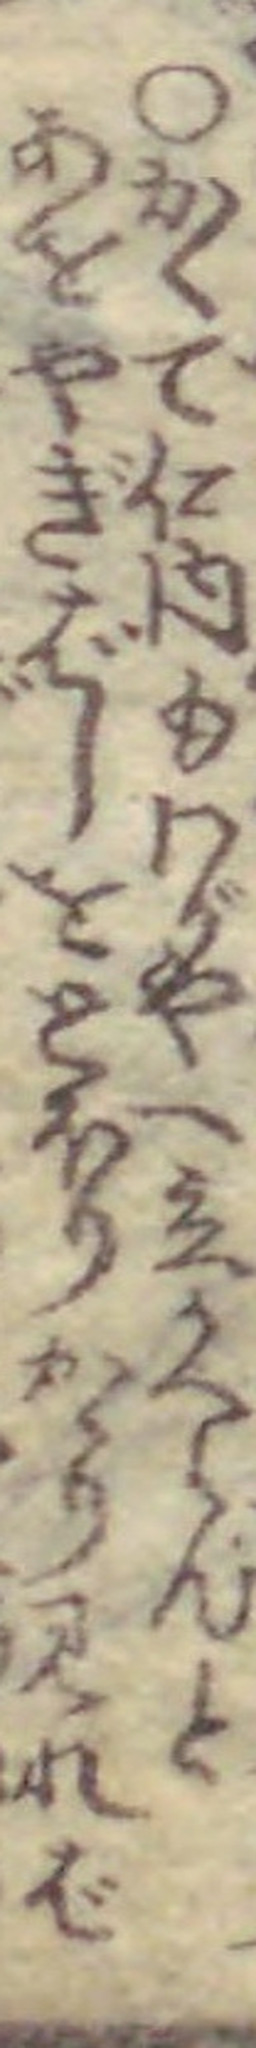あをやぎばしをとほりかゝり見れば
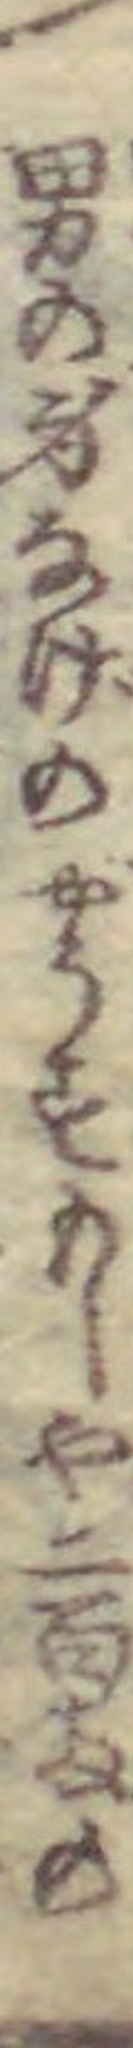男の身なげのやうすもしや二百両の
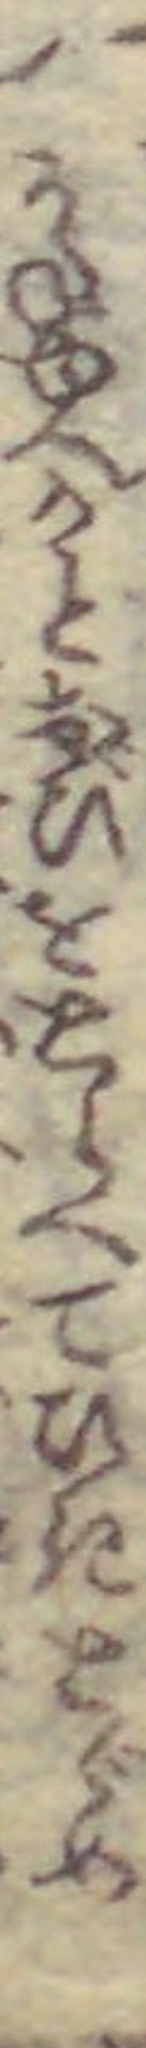かねゆへかとおびをとらへてひきとゞめ
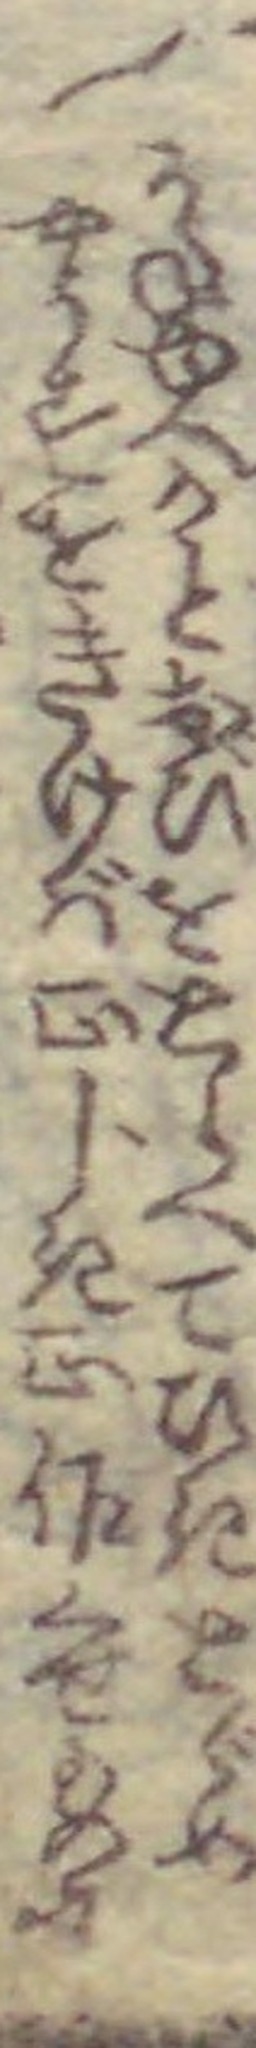やうすをきけば正じき正作くせものに
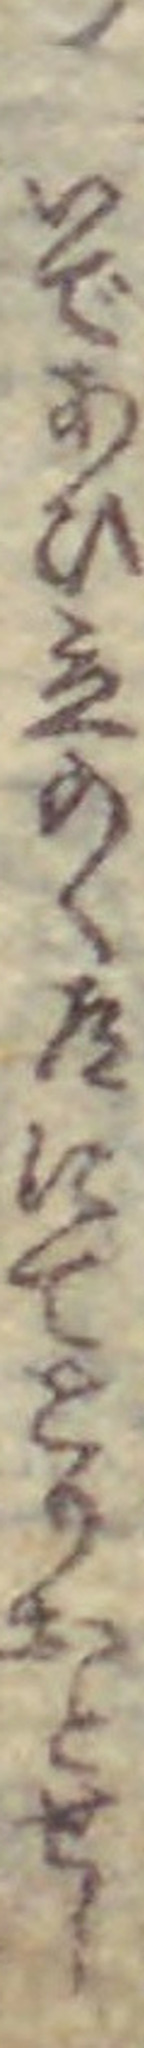いであひ立のく道にてとりおとせし
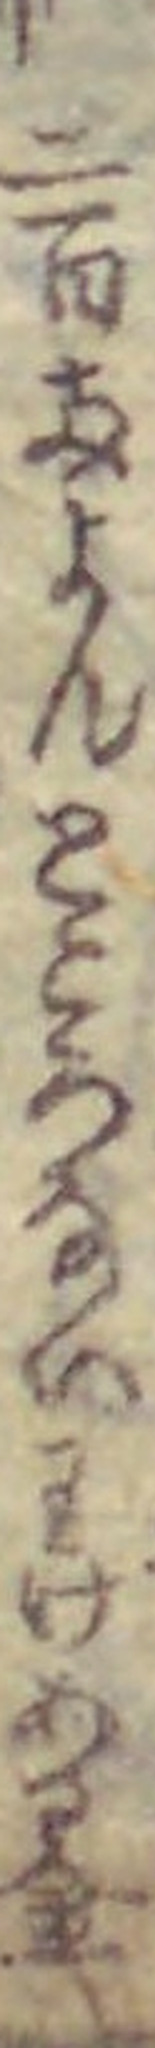二百両よんところないわけある金
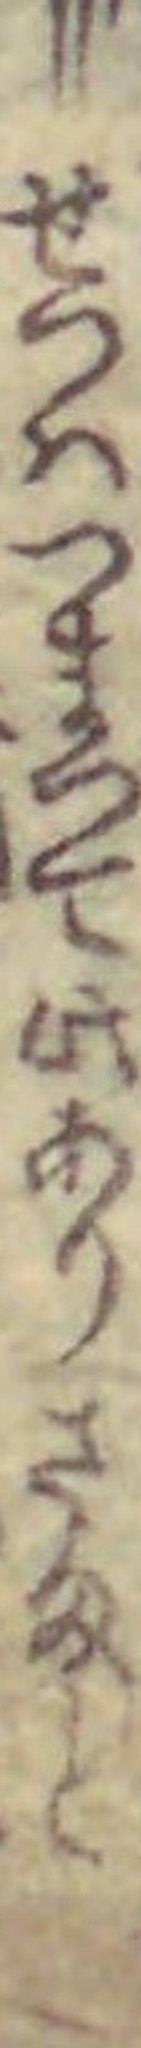せつはつまつて此ありさまと
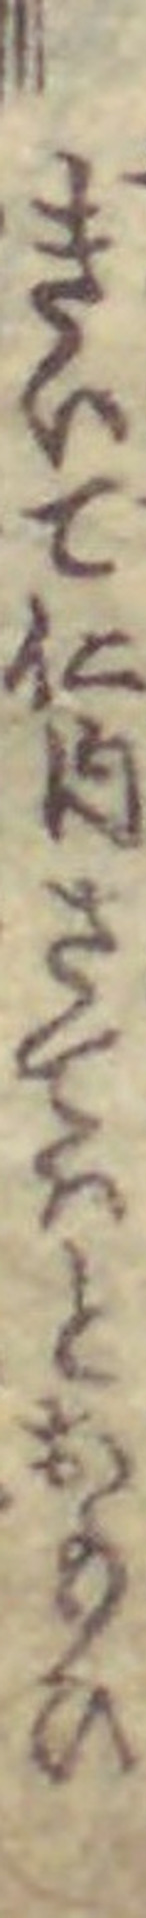きいて仁内さてはとおもひ
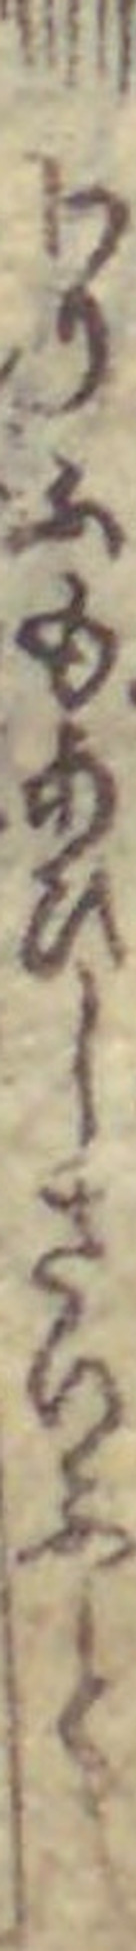わりふもあひしさいふと

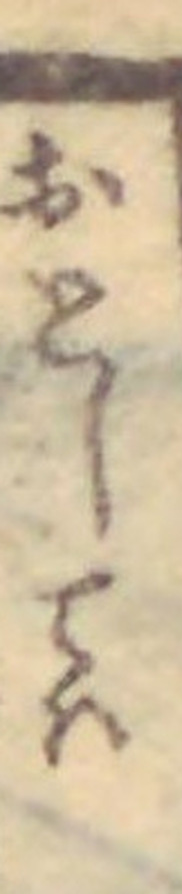おとしては
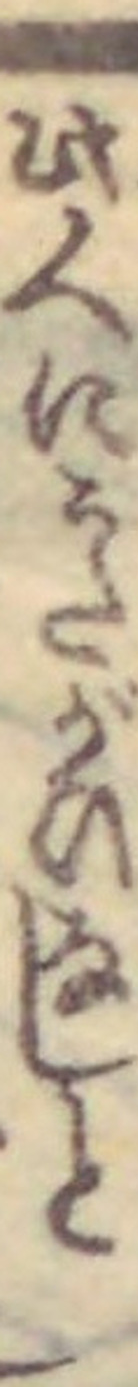此人にうたがひなし
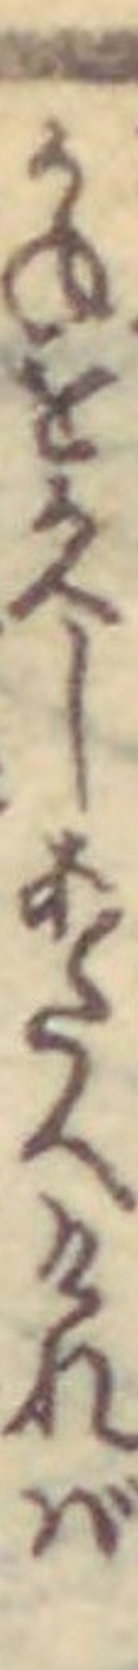とかねをかへしあたへければ
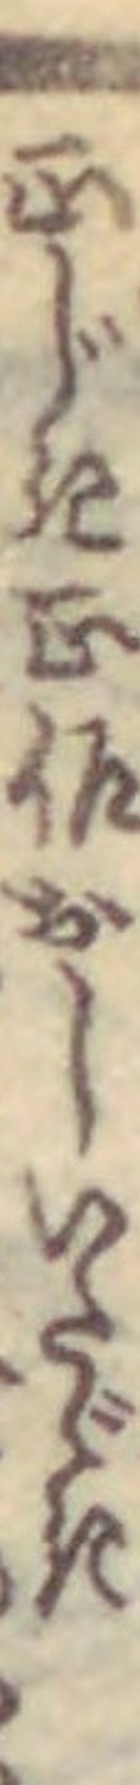正じき正作おしいたゞき
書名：八ツ目鱣因縁物語 3巻
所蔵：国立国会図書館 National Diet Library, JAPAN
